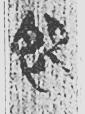即
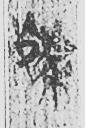殜
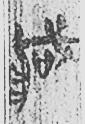戕
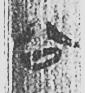公
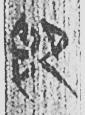即
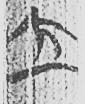立
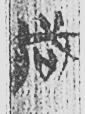戕
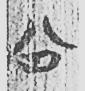公
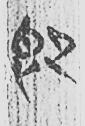即
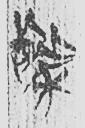殜
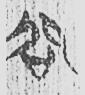卲
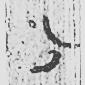公
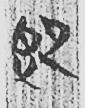即
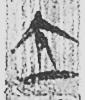立
